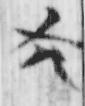犬
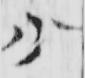少
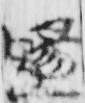陽
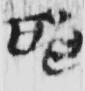申
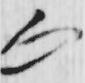㠯
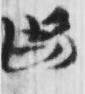○（廷）
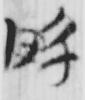阩
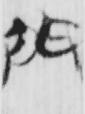門
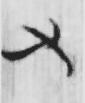又
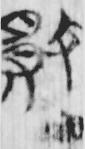敗
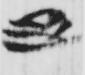疋
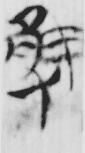○（雘）
